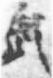須
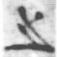之
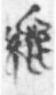○（紕）
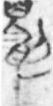○（貂）
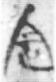定
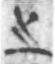之
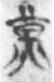黃
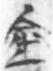金
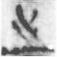之
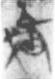○（伐）
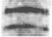二
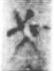戈
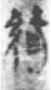紫
